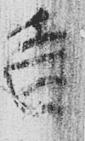昏（聞）
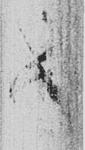民
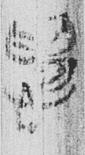○（懋）
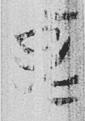孔子
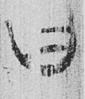曰
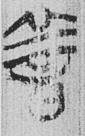善
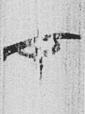才（哉）
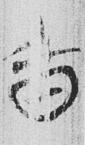昏（聞）
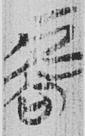○（乎）
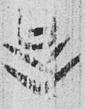足
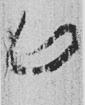㠯（以）
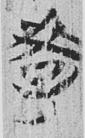○（教）
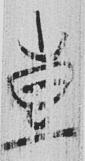壴（矣）
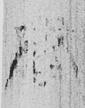君
